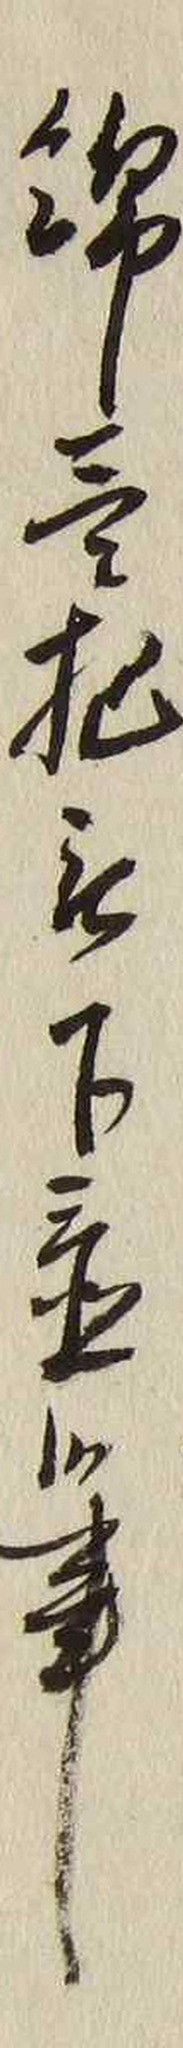綿壱把被下置候事
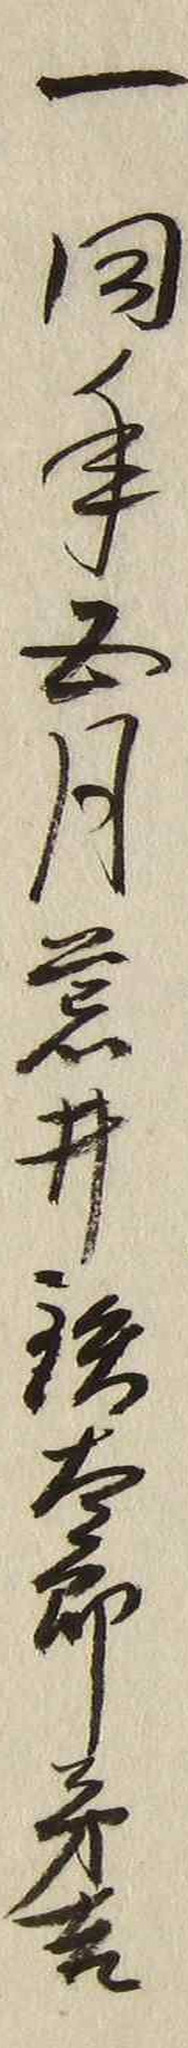一同年五月荒井鉄太郎弟吉

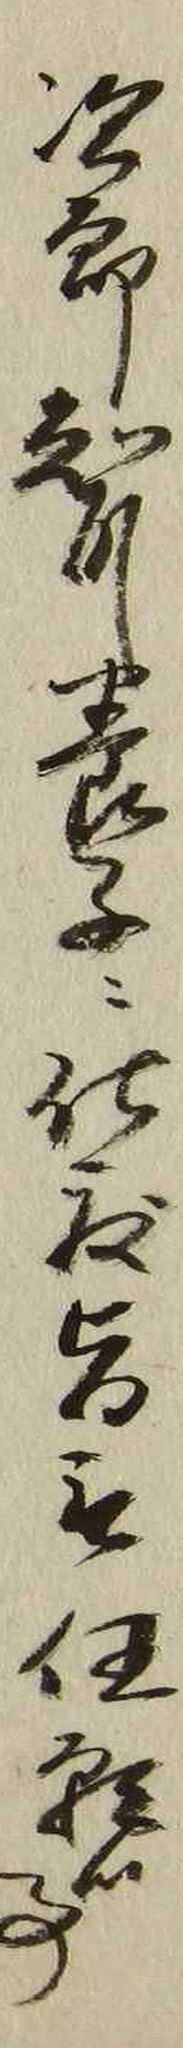次郎婿養子ニ仕度旨被任願候事
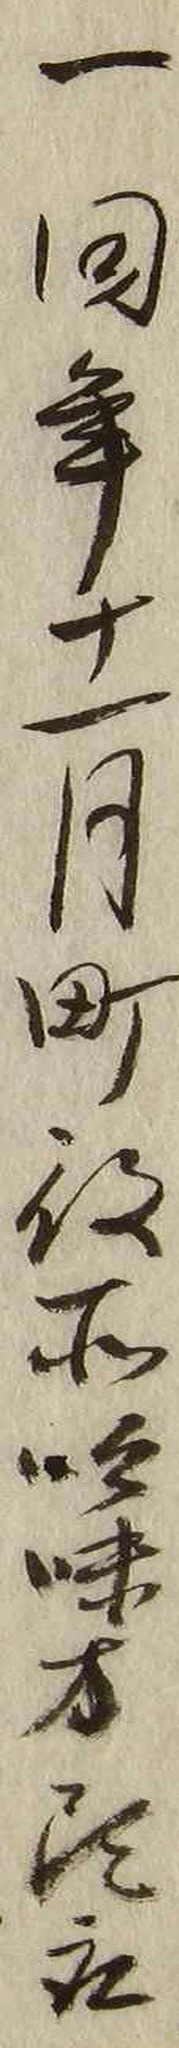一同年十一月町役所吟味方頭取
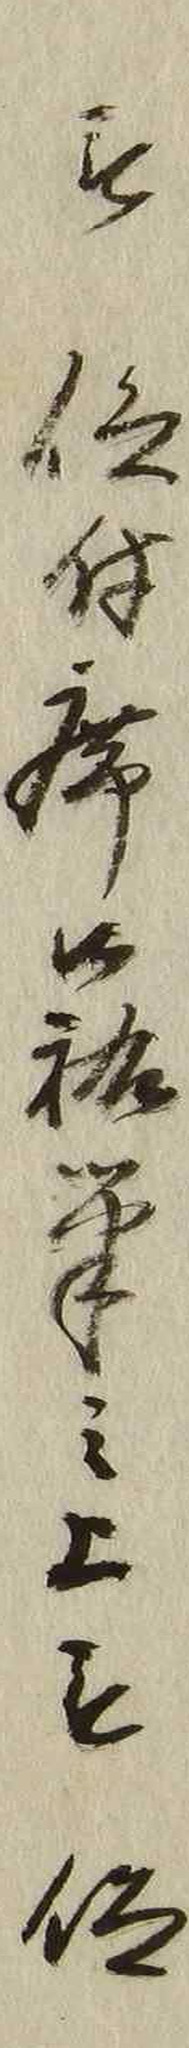被仰付席候御祐筆之上被仰
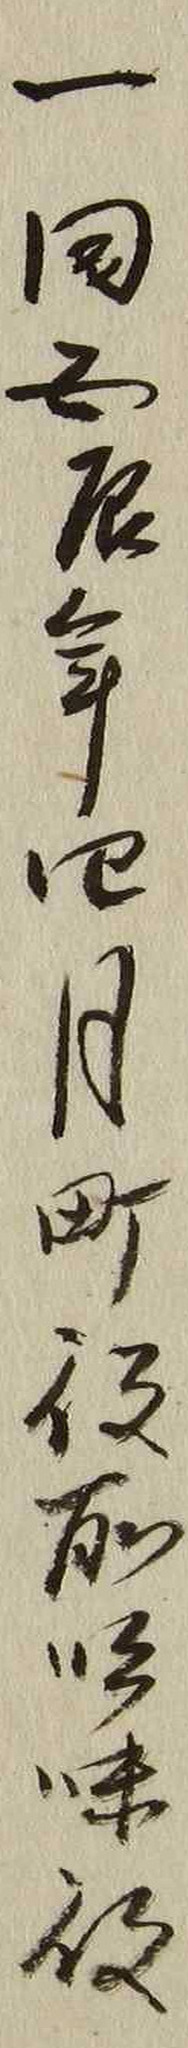一同五辰年四月町役所吟味役
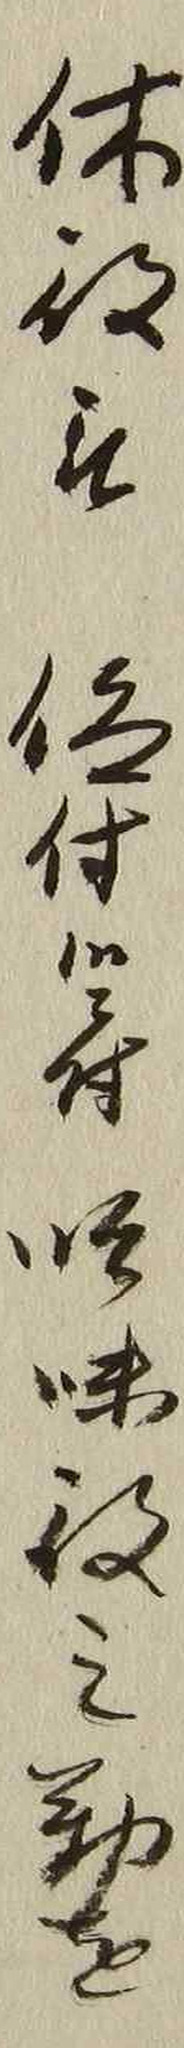休役被仰付候ニ付吟味役之勤を
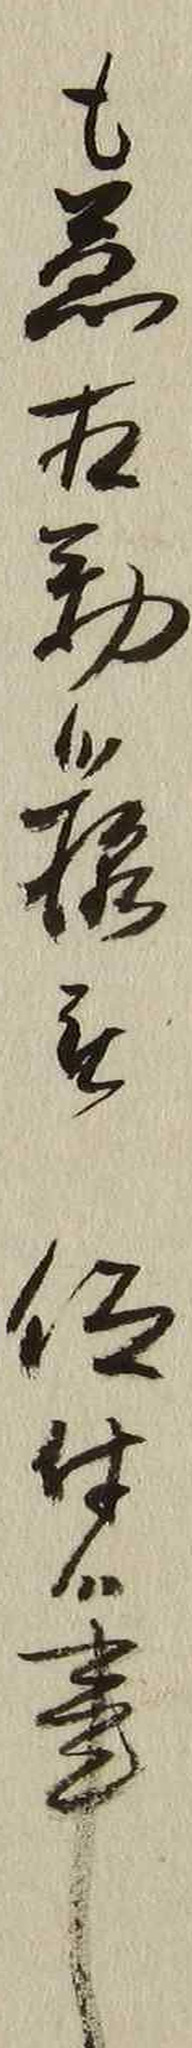も兼相勤候様被仰付候事
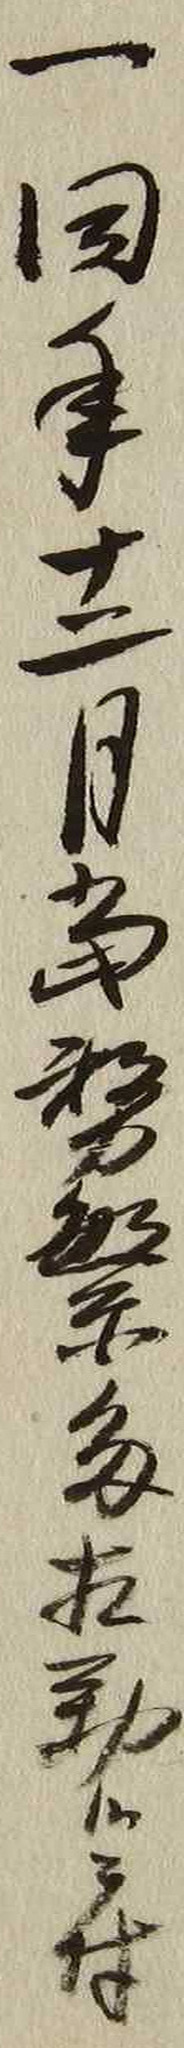一同年十二月当務繁多相勤候ニ付
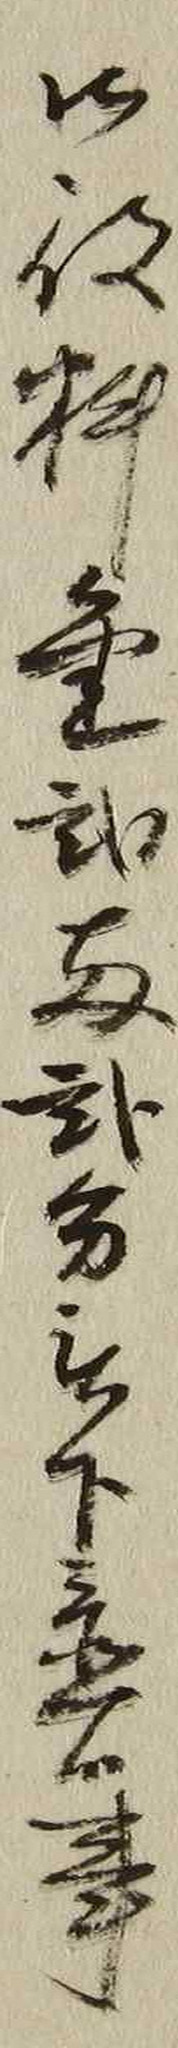御役料金弐両弐分被下置候事
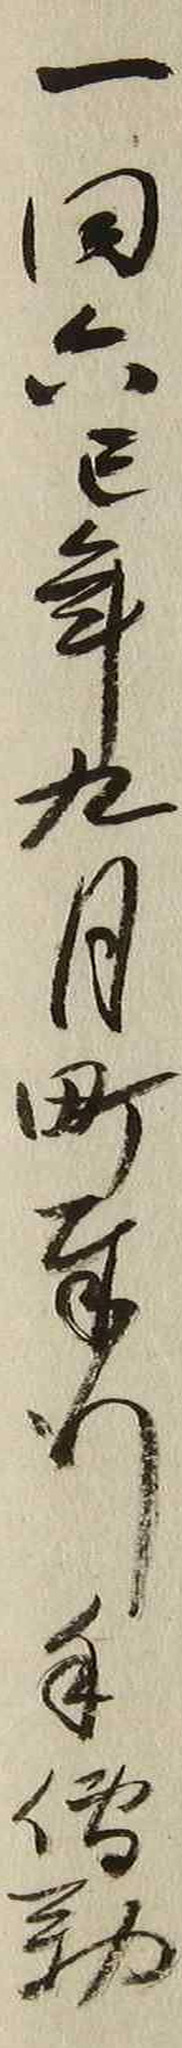一同六巳年九月町奉行手伝勤
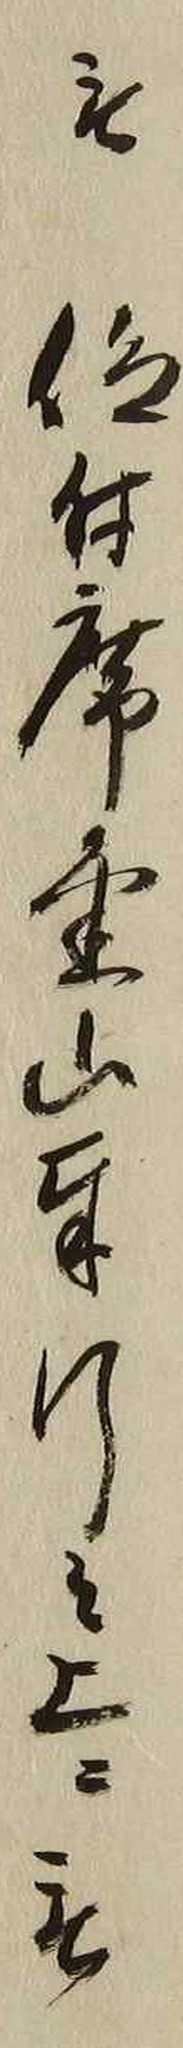被仰付席金山奉行之上ニ被
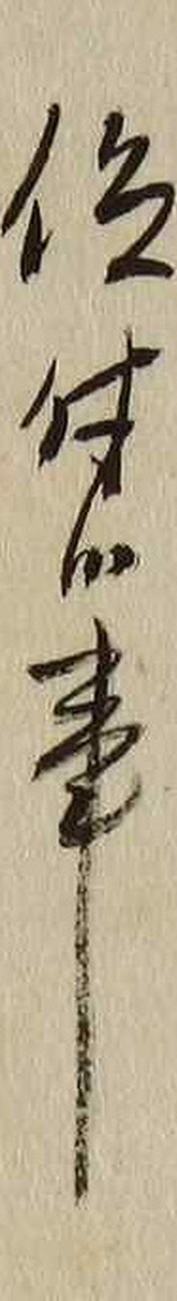仰付候事
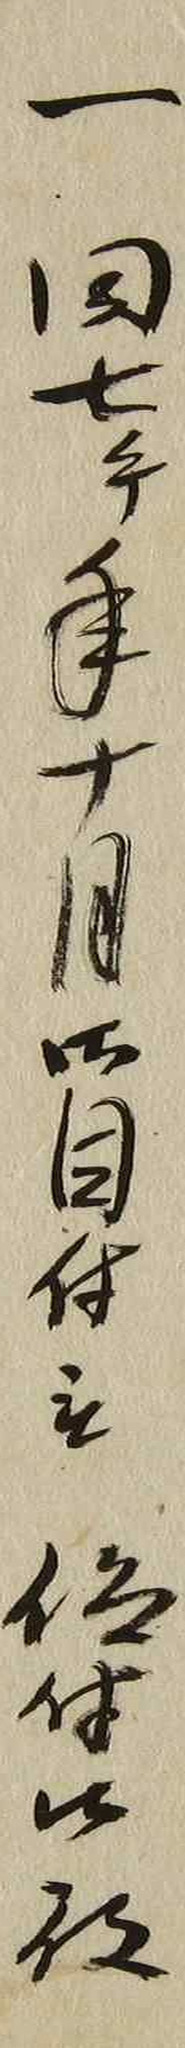一同七午年十月御目付被仰付御役
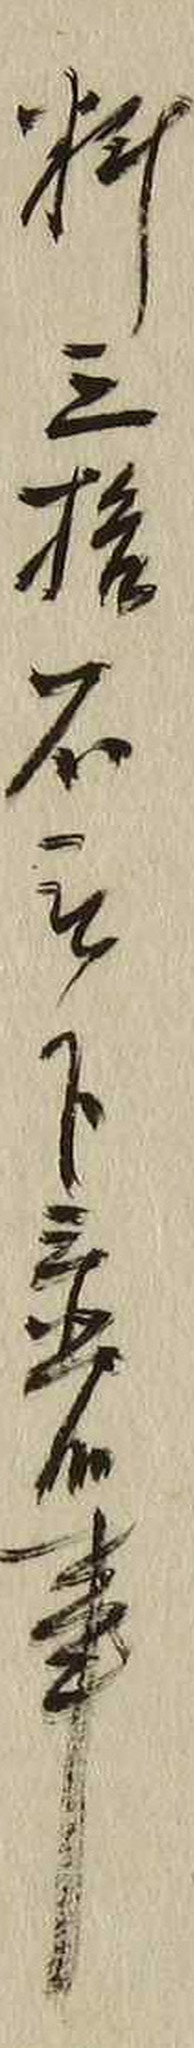料三拾石被下置候事
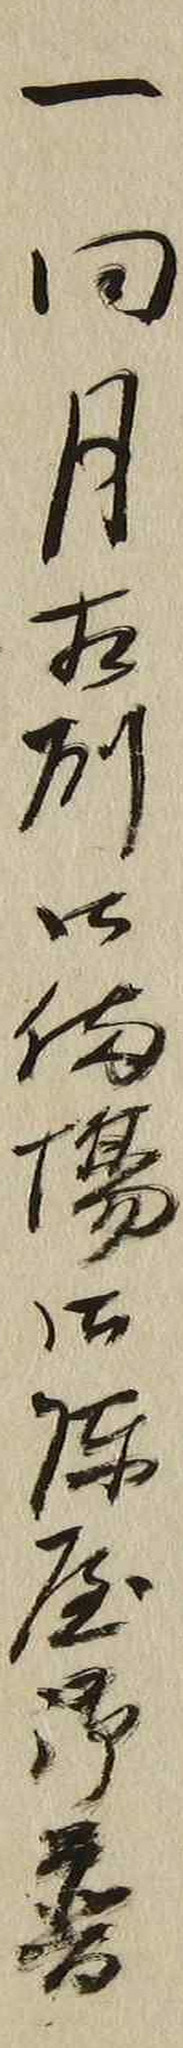一同月相州御備場御陣屋御普
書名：諸士系譜　巻之346　も之部2
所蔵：会津若松市立会津図書館
